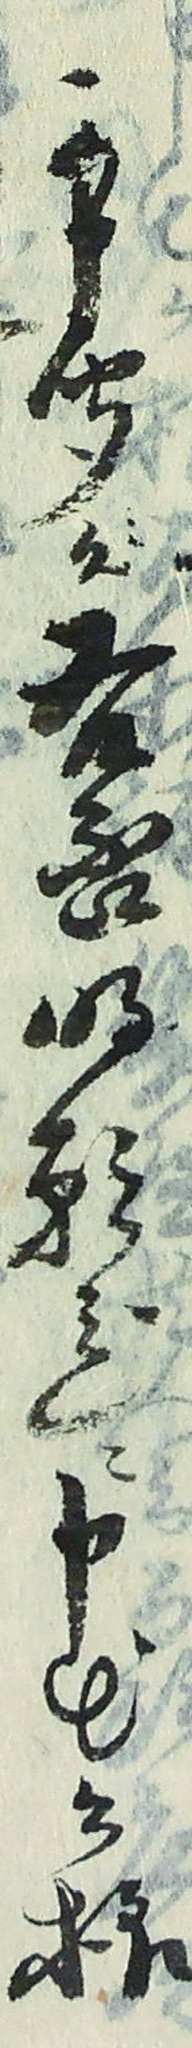可申聞候右否明朝迄ニ申出候様
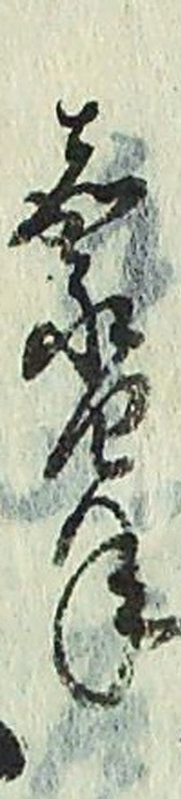嘉永四年
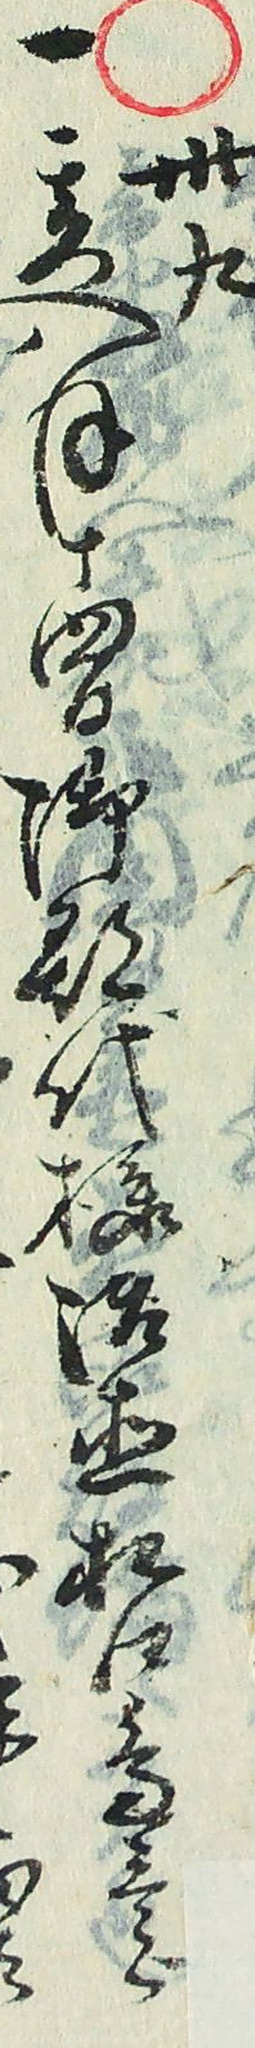一亥八月十四日御郡代様御直松江島三郎
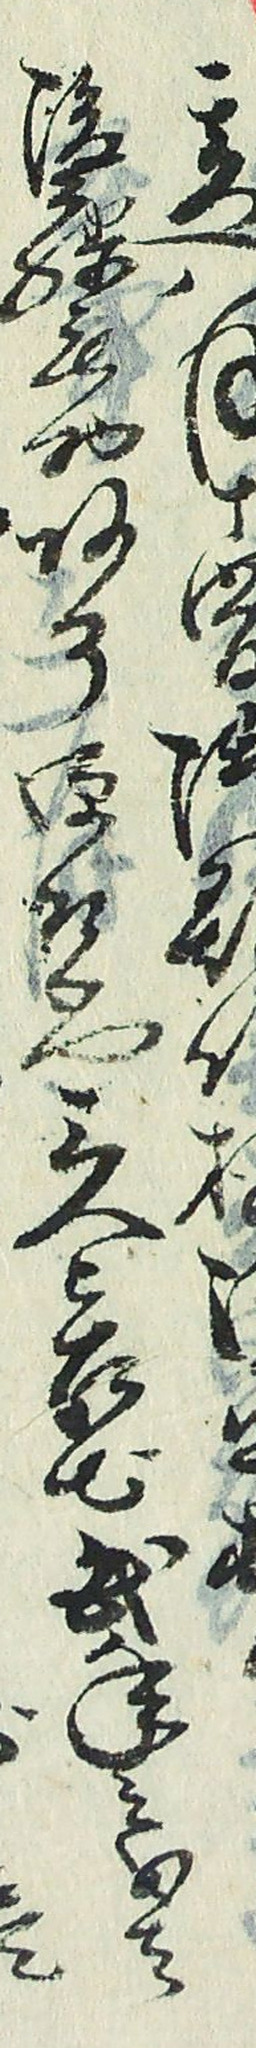後藤庄助阿部源左衛門三人被召出當年之義者
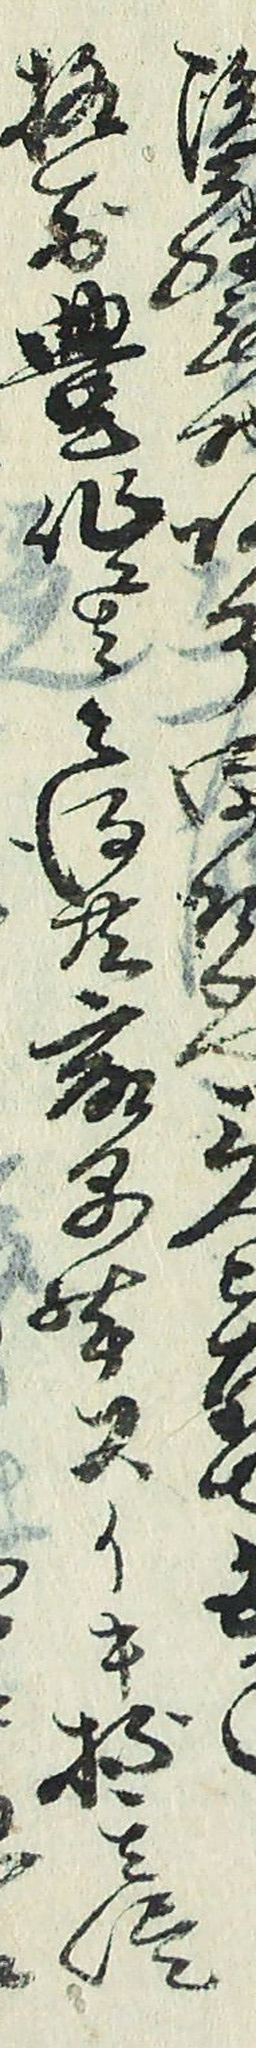格別豊作ニ者候得共最早芋スイキ抔其儘
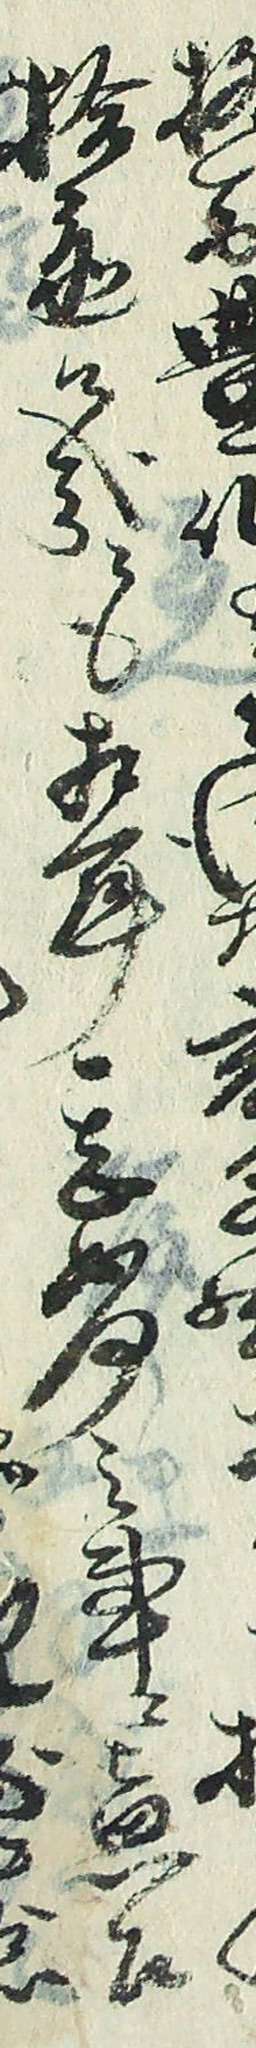捨置候哉ニも相聞甚如何之事ニ被思召
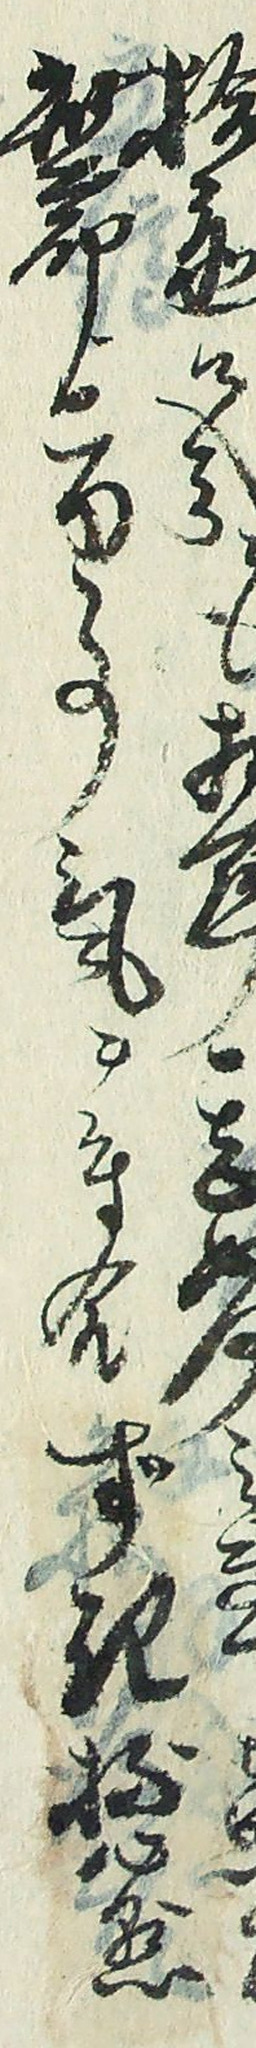此節ゟ万事気ヲ付合ずき抔心懸

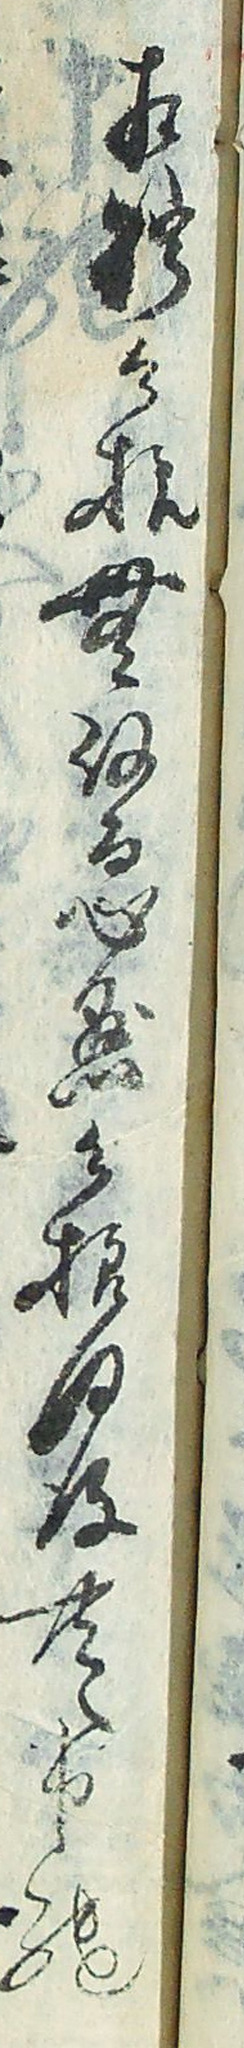相貯候様無何而心懸候様村役共へ申継
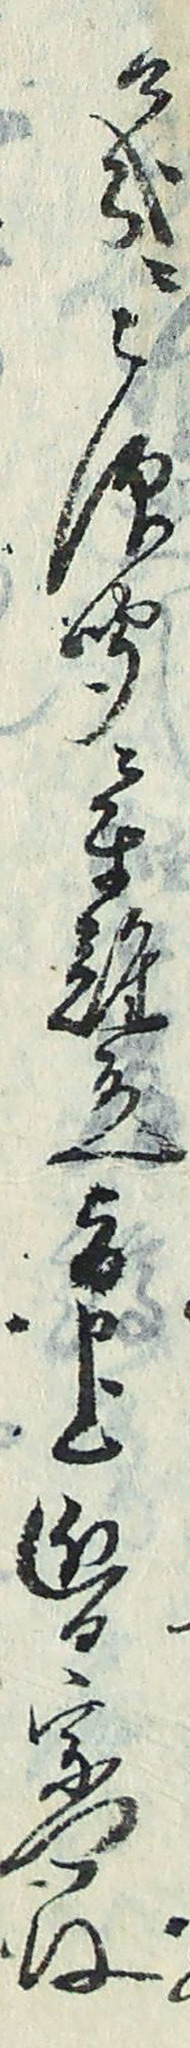候哉ニ被仰聞ニ付難有旨申上近日宗門改
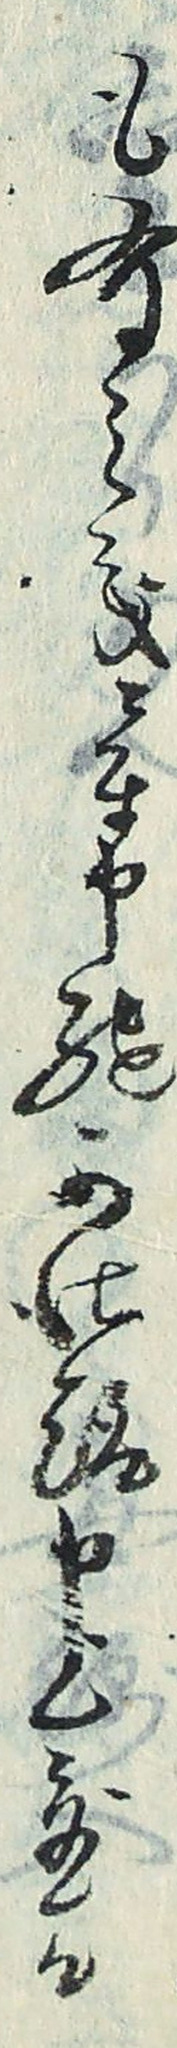も有之義ニ付申継可仕趣申上置候
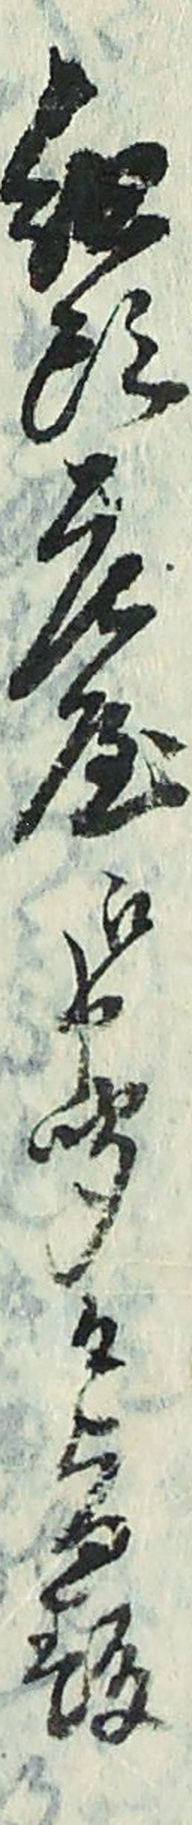組頭庄屋江申聞候旨趣
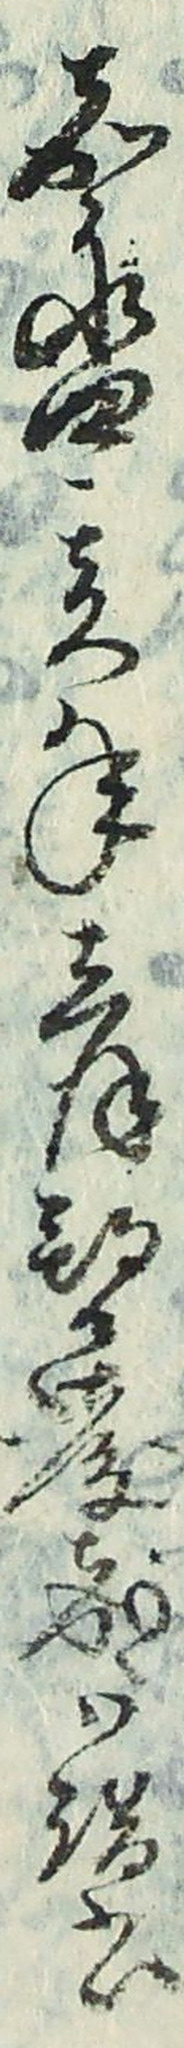嘉永四亥年十二月朔日御渡被成候御端書
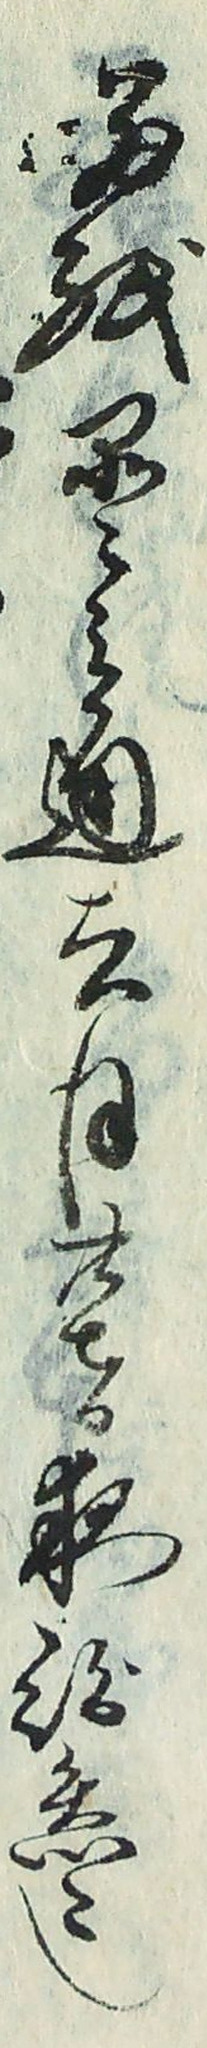別紙品々之通去月廿七日夜紛失いたし
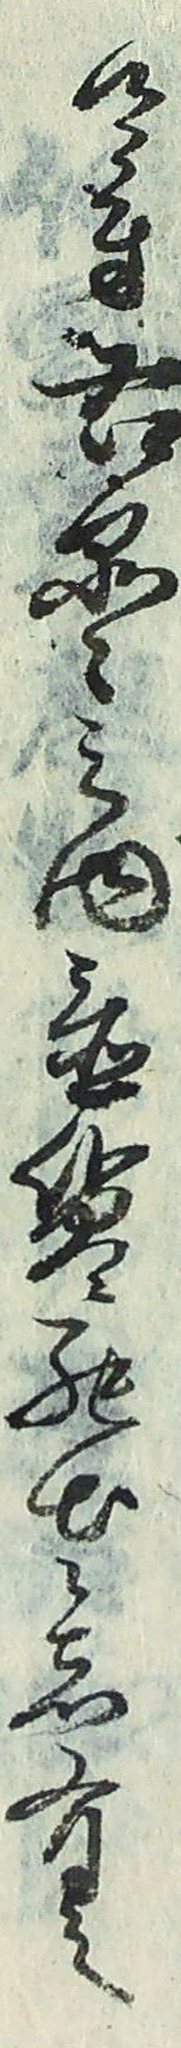候ニ付右品々之内置質ニ罷出候者有之
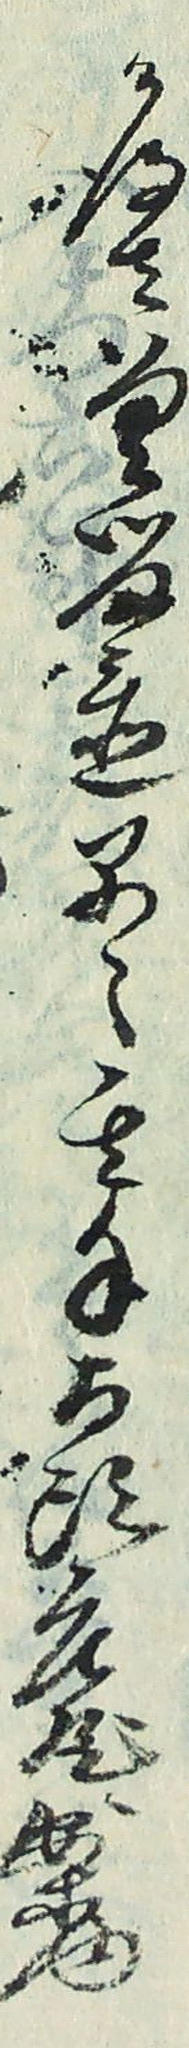候得者差留置早々其手与頭庄屋へ案内
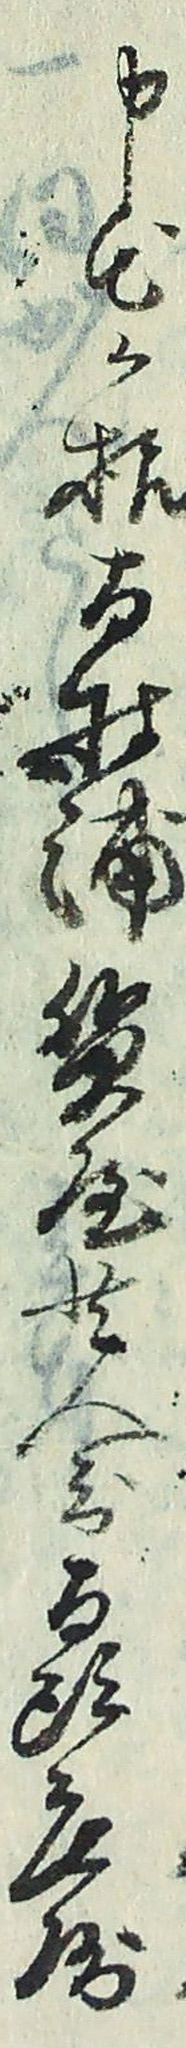申出候様与村浦質屋共人別与頭庄屋
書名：諸御趣意書并御下知向之写
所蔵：鳴門教育大学 Naruto University of Education
